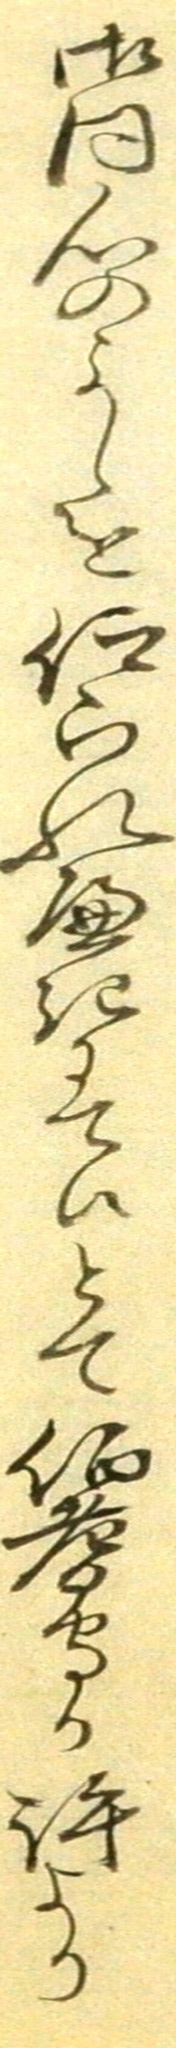御同心のよしを伝られへきにて候とて伯耆守か許より
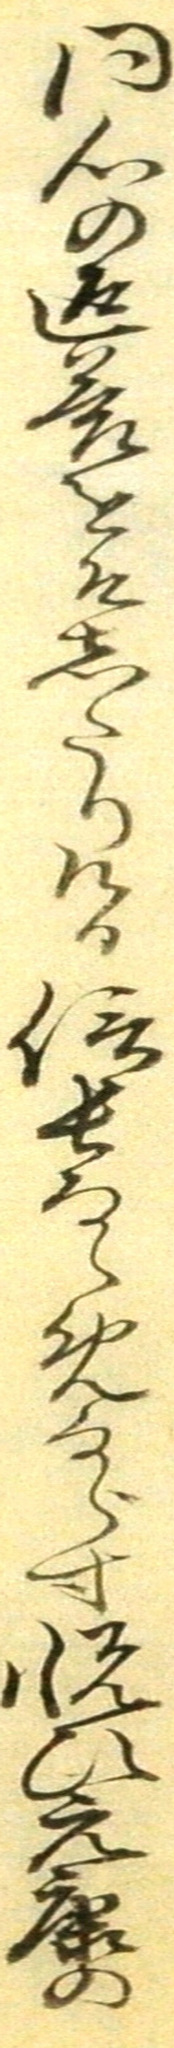同心の返答をそしたりける信長なゝめならす悦ひ元康の
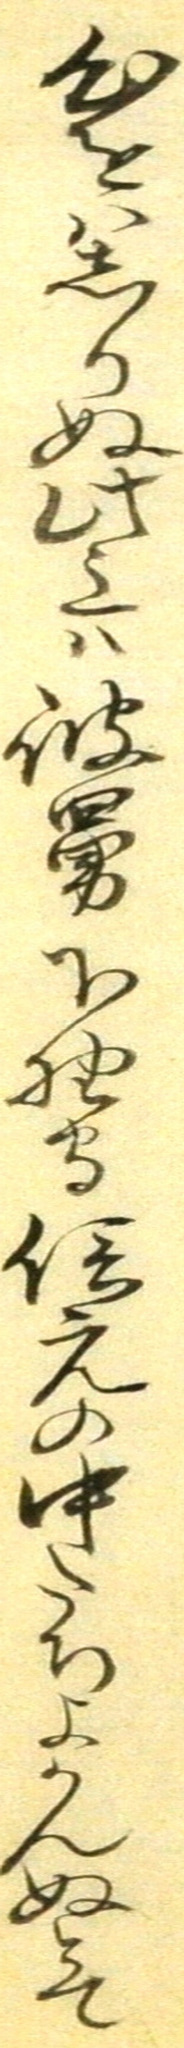心をはしりぬ此上は彼舅下野守信元の中たちよかんぬとて
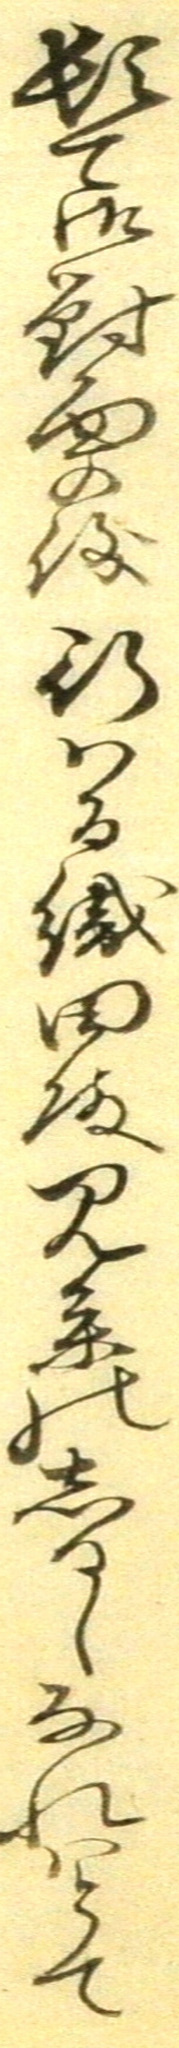頓て御対面の後行はる織田殿見参のしるしなれはとて
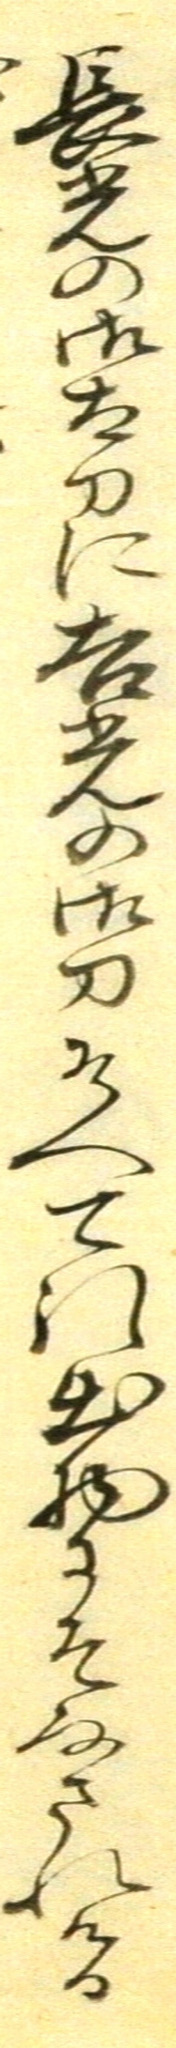長光の御太刀に吉光の御刀そへて引出物にそなされける
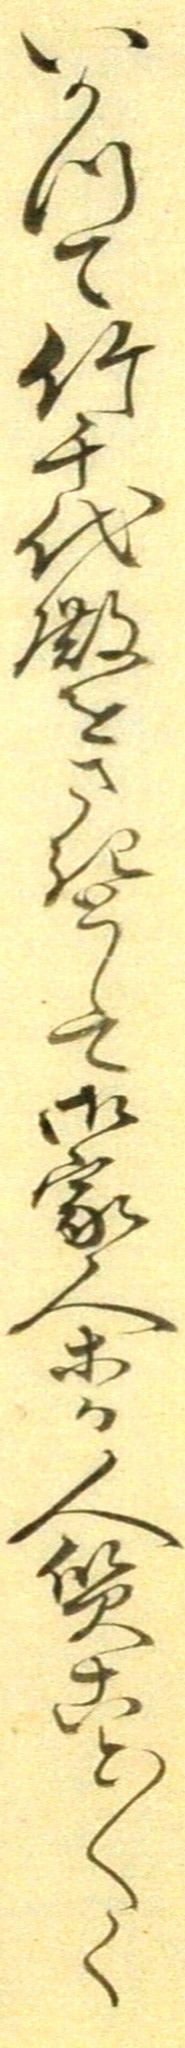いかつて竹千代殿をさきとして御家人等か人質こと〳〵く
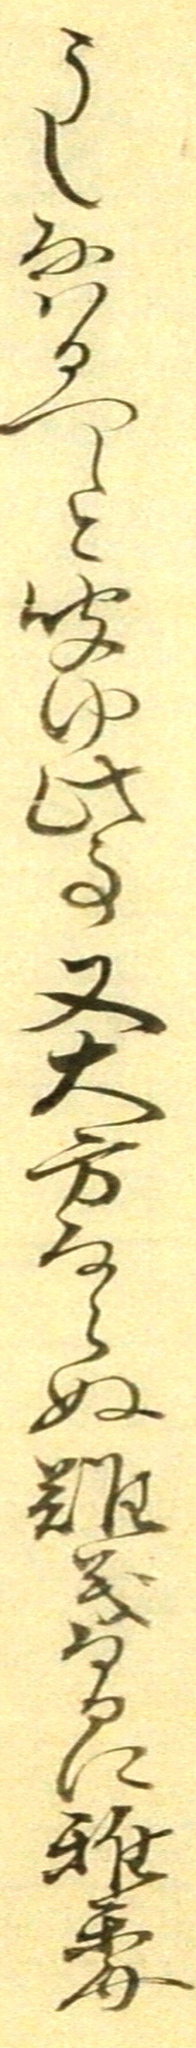うしなはるへしと聞ゆ此事又大方ならぬ難義なるに雅楽介
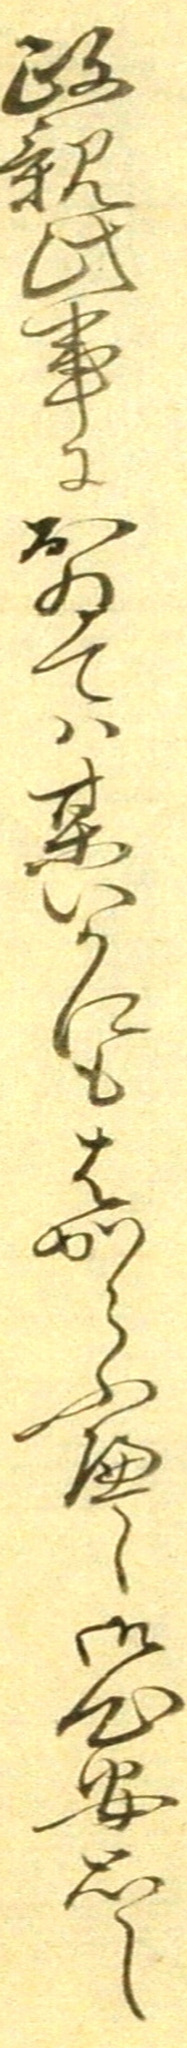政親此事におゐては某いかにもはからふへし御心安思し
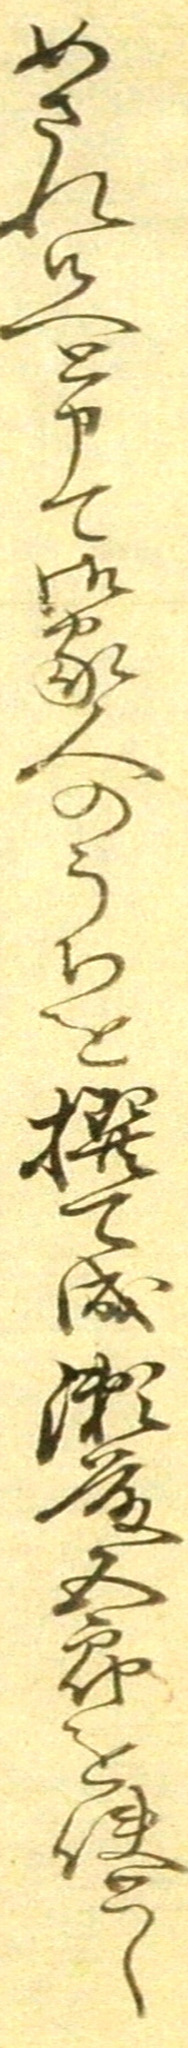めされ候へと申て御家人のうちを撰て成瀬藤五郎を使とし
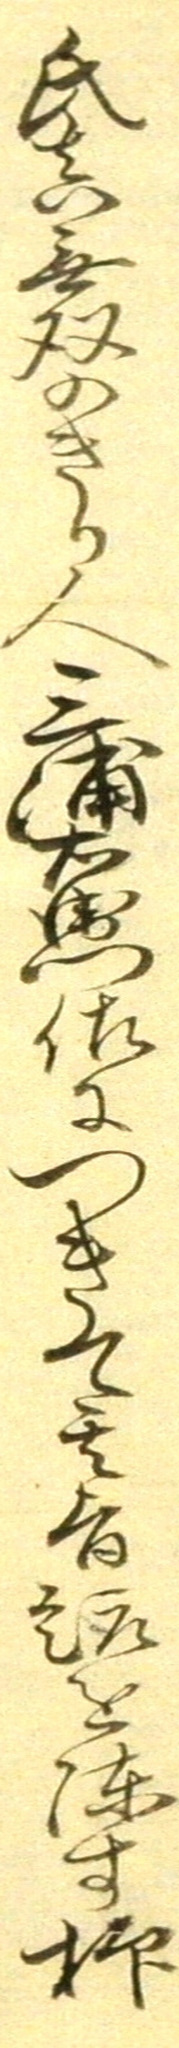氏真無双のきり人三浦右衛門佐につきて其旨趣を陳す抑
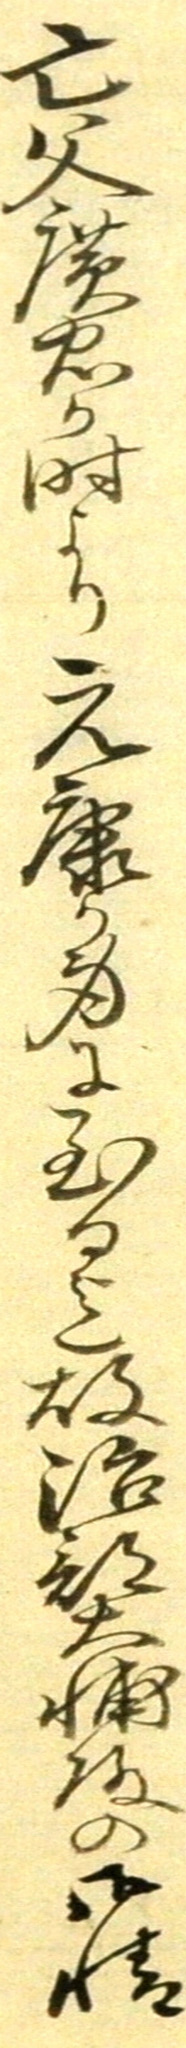亡父広忠か時より元康か身に至る迄故治部大輔殿の御情
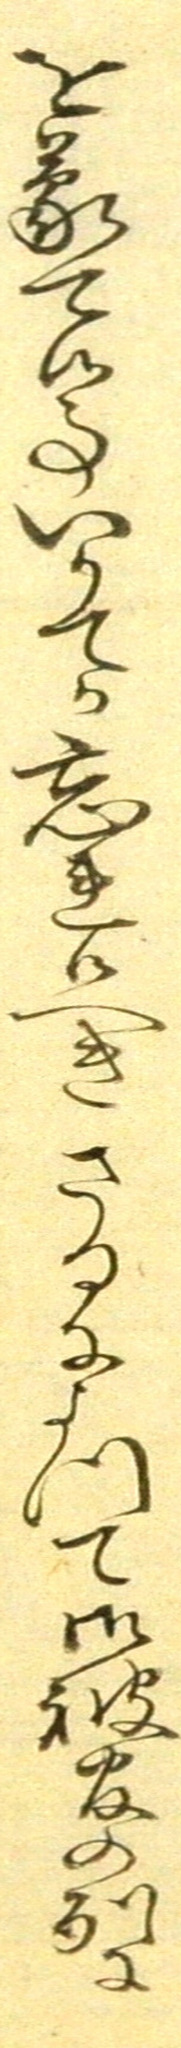を蒙て候事いかてか忘れ候へきさるによつて御被官の列に
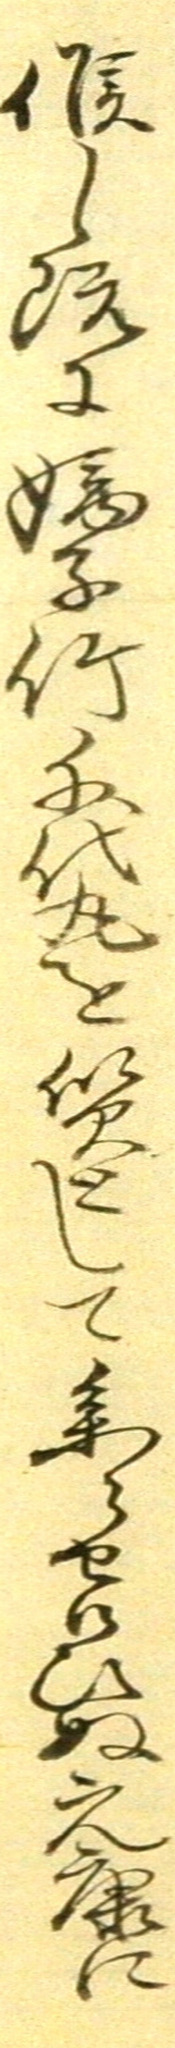候し既に嫡子竹千代丸を質として参らせ候ひぬ元康に
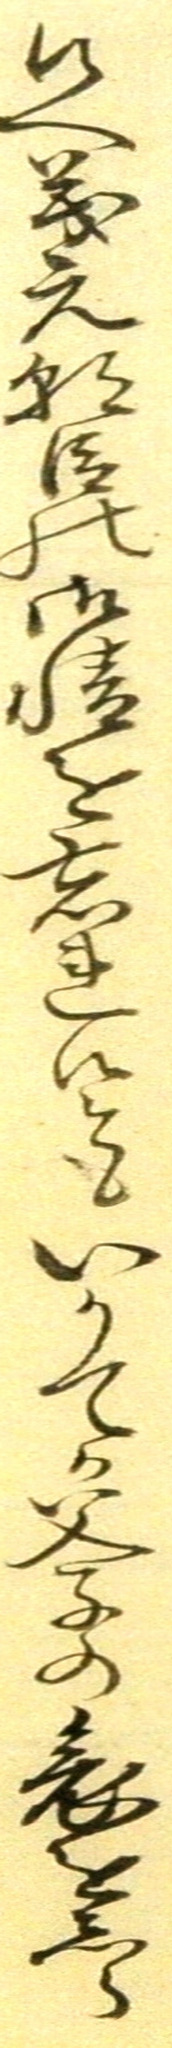候へ義元朝臣の御情を忘れ候ともいかてか父子の哀をしら
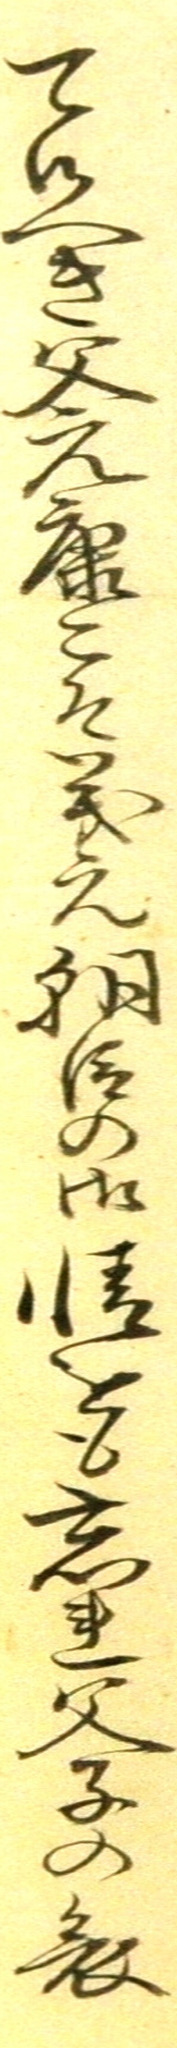て候へき父元康こそ義元朝臣の御情をも忘れ父子の哀

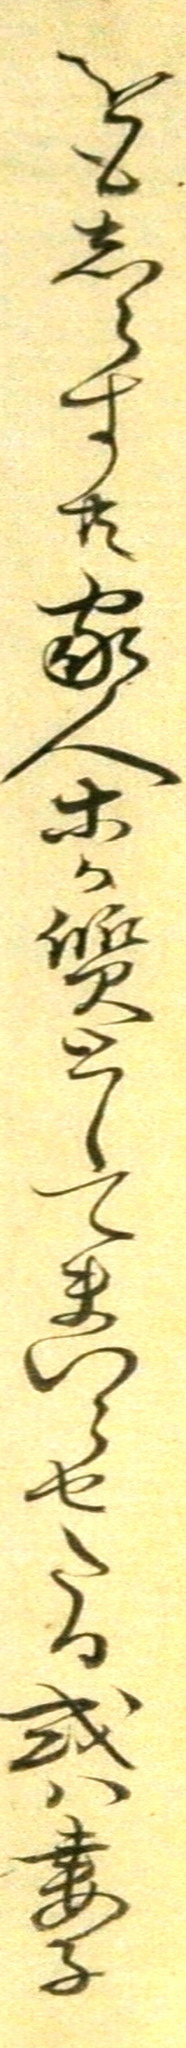をもしらす共家人等か質としてまいらせたる或は妻子
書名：藩翰譜（五）
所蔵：伊那市立高遠町図書館・合同会社AMANE
